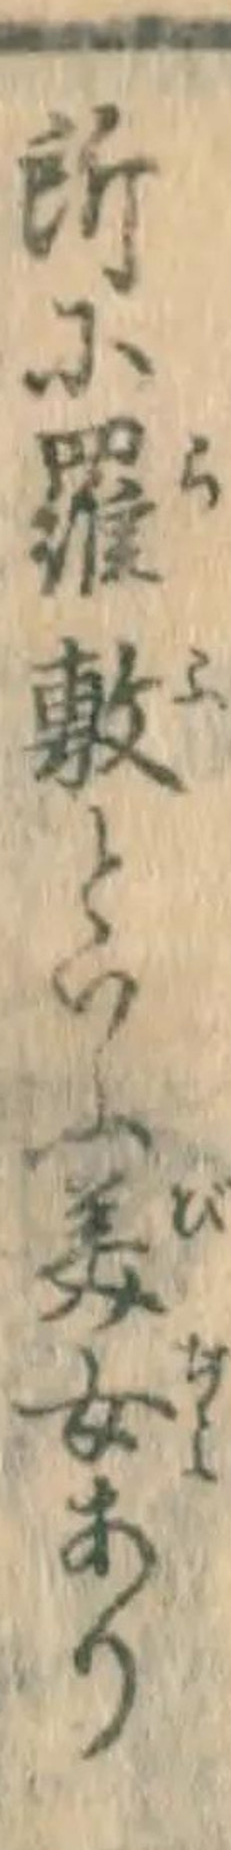所に羅敷といふ美女あり
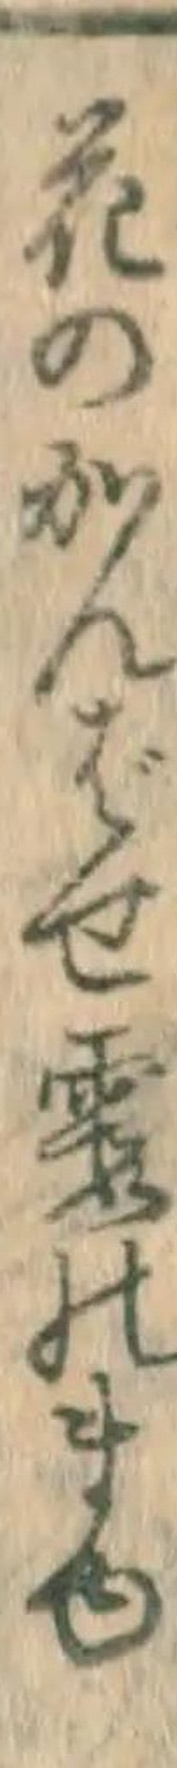花のかんばせ霞のまゆ
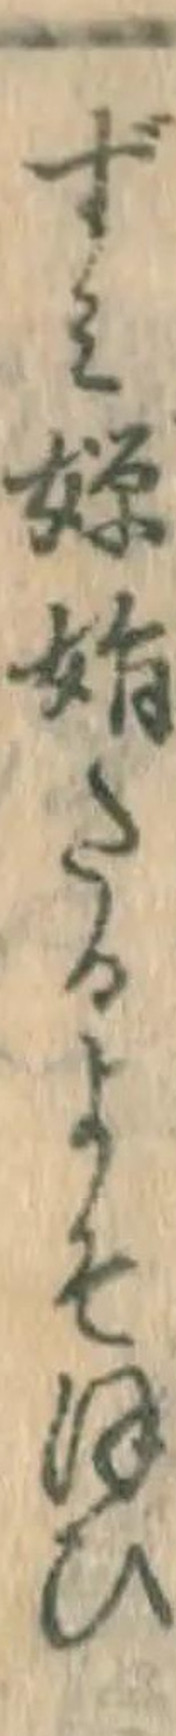ずみ嬋娟たるよそほひ
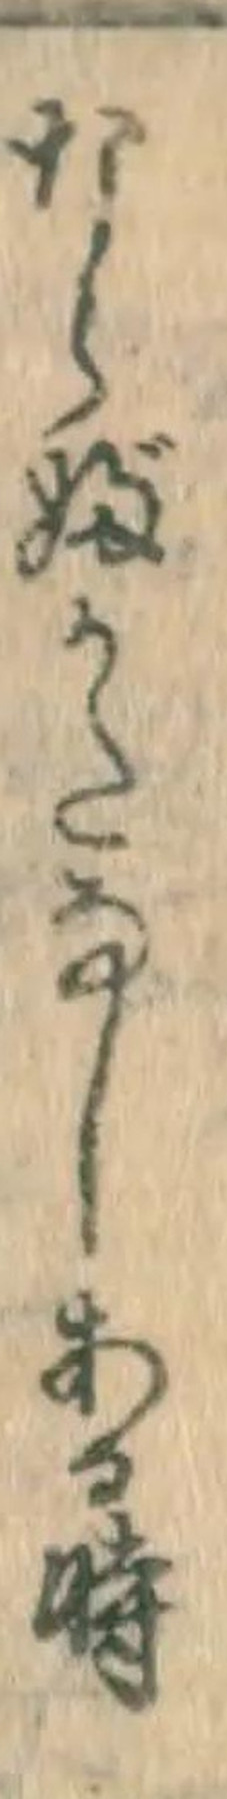ならぶかたなしある時
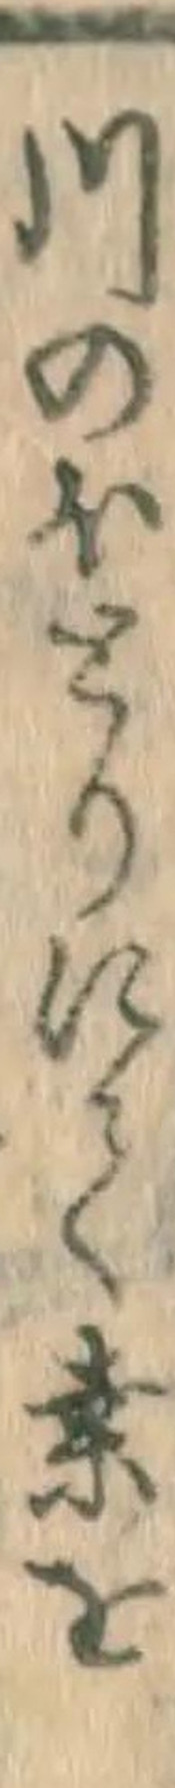川のほとりにて桑を
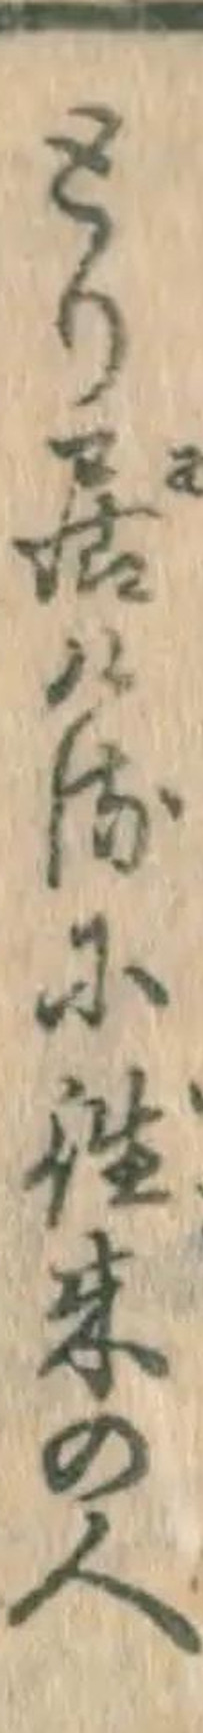とり居けるに往来の人
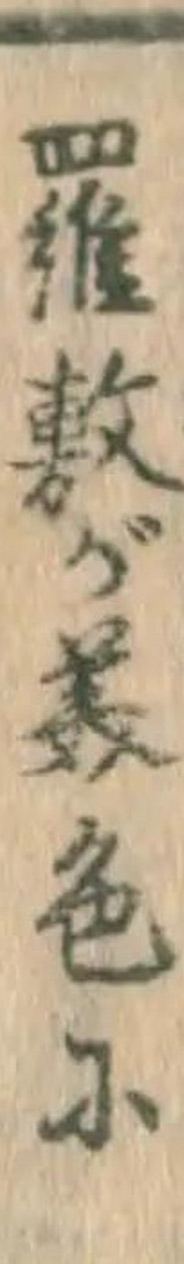羅敷が美色に
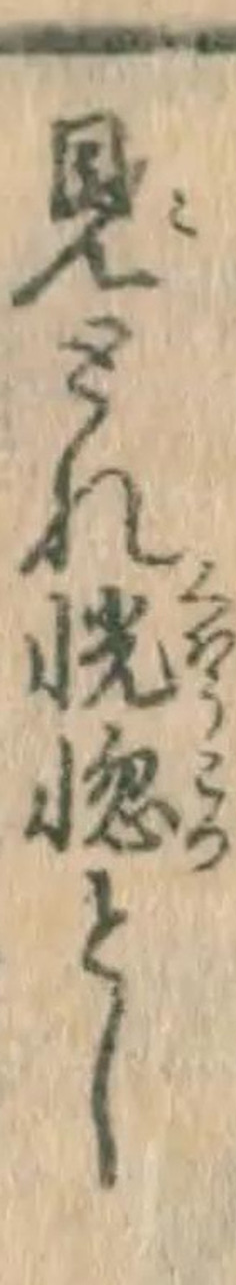見とれ恍惚とし
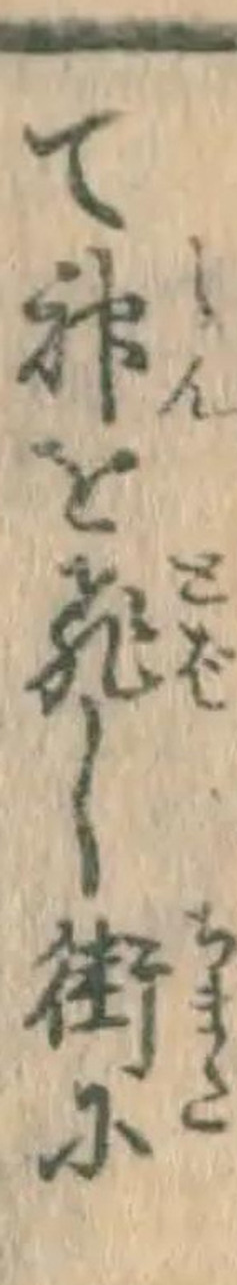て神を飛し街に
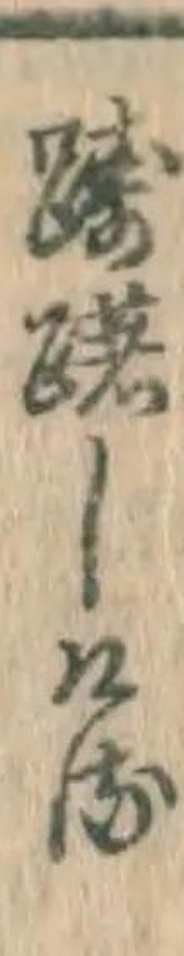躊躇しける
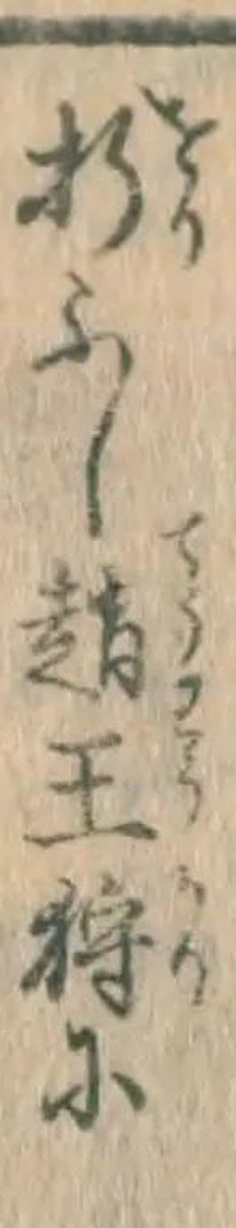折ふし趙王狩に
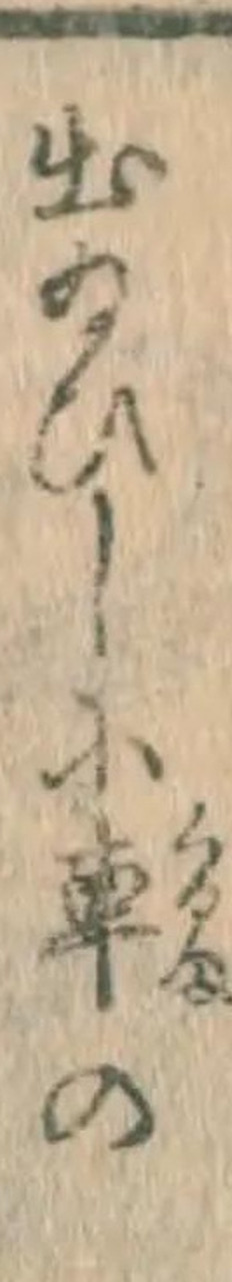出給ひしに車の
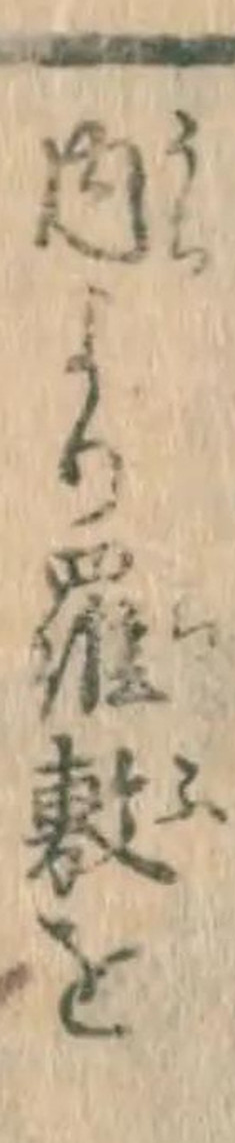内より羅敷を
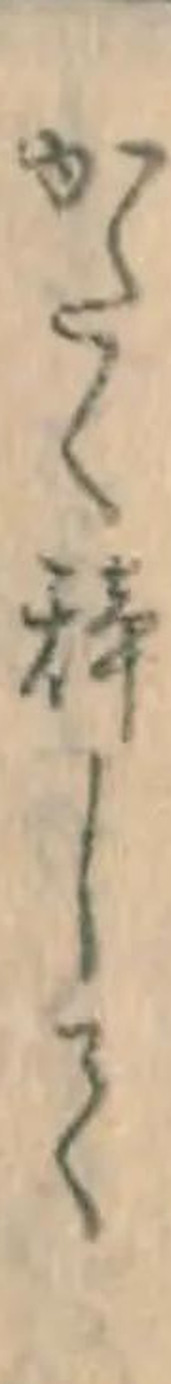かたく辞して
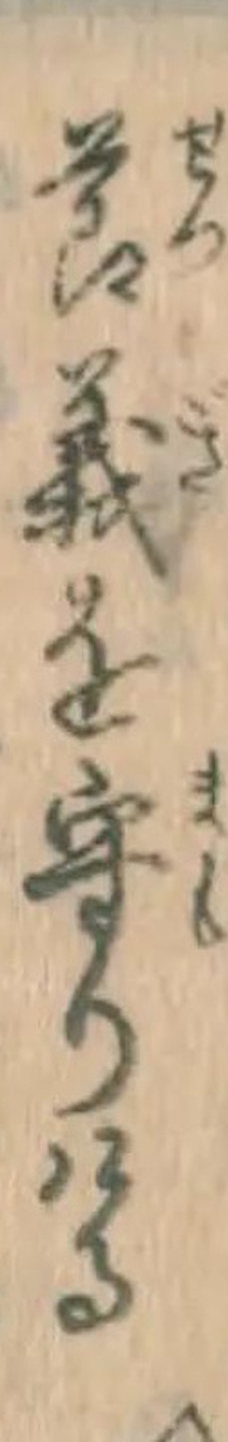節義を守りける
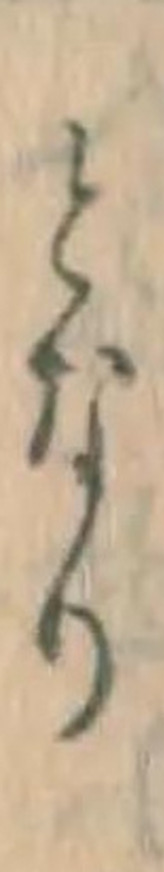となり
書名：養蚕秘録 3巻. [3]
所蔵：国立国会図書館 National Diet Library, JAPAN
